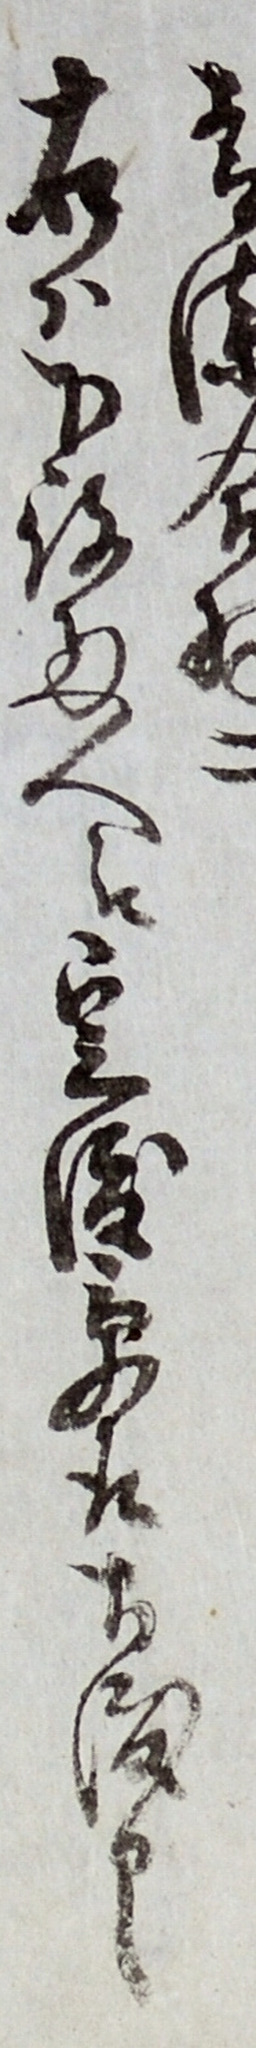右ハ下役両人江定渡受取相渡申候
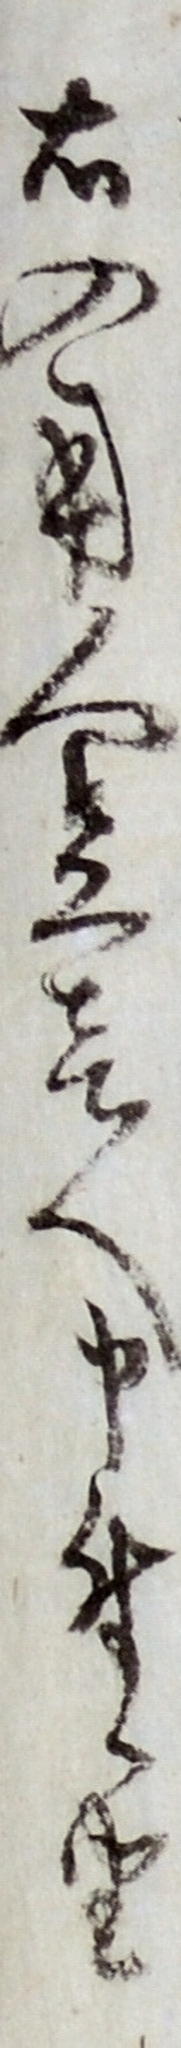右入用人足壱人申付候由

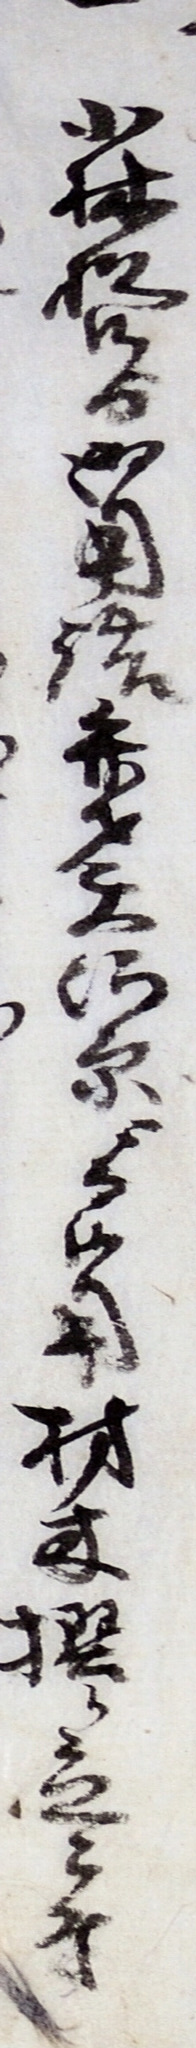一小林杦左衛門御用詰弁才天河原ニ而御用材木撰り立ニ付
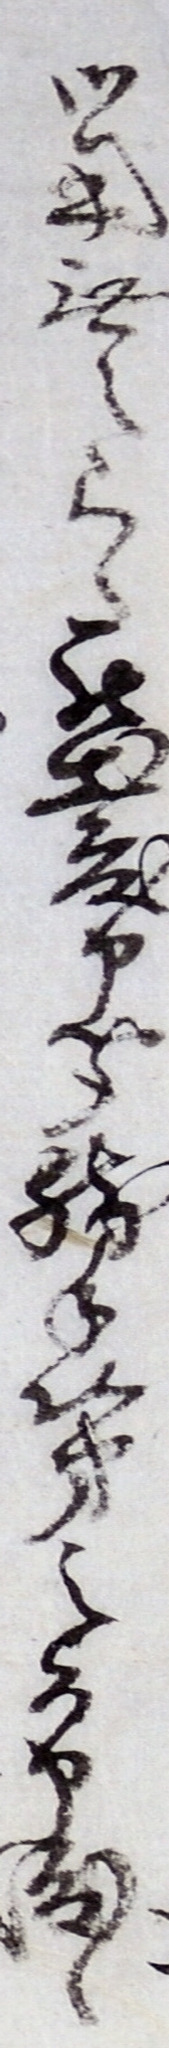御用無之候ハヽ罷出度申聞勝手次第之旨申渡候
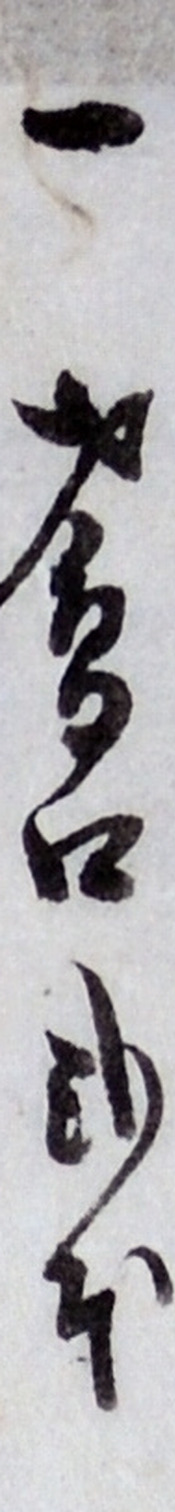一鳶口弐本
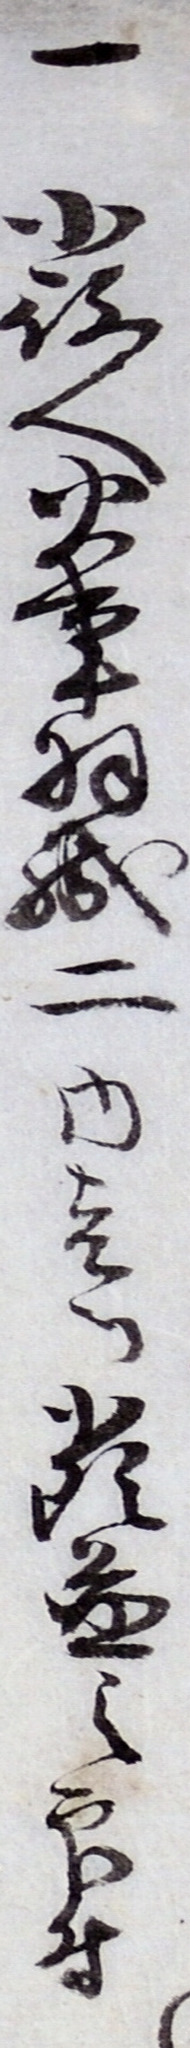一小役人火事羽織二内壱ツ御頭並之印付
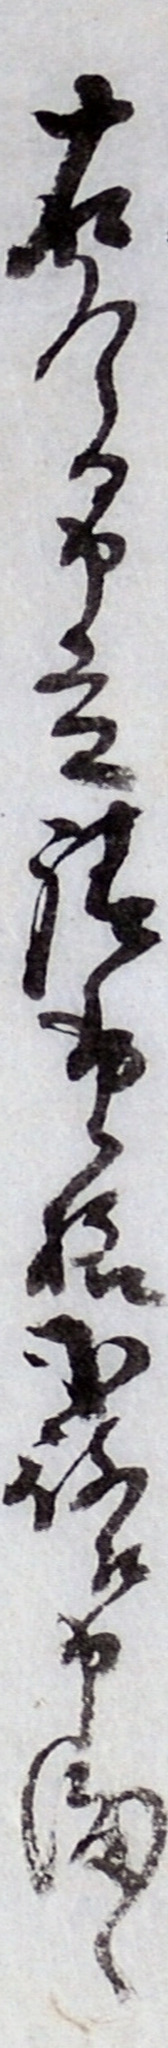右今日申立請取候様下役江申渡候
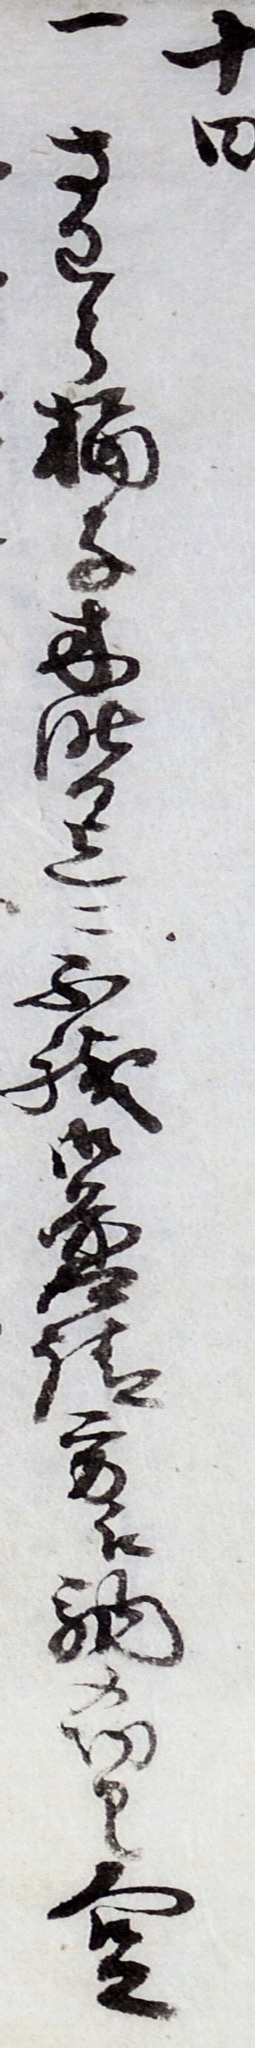一さわら桶子木昨日迄ニ不残御普請方江納メ切申候人足
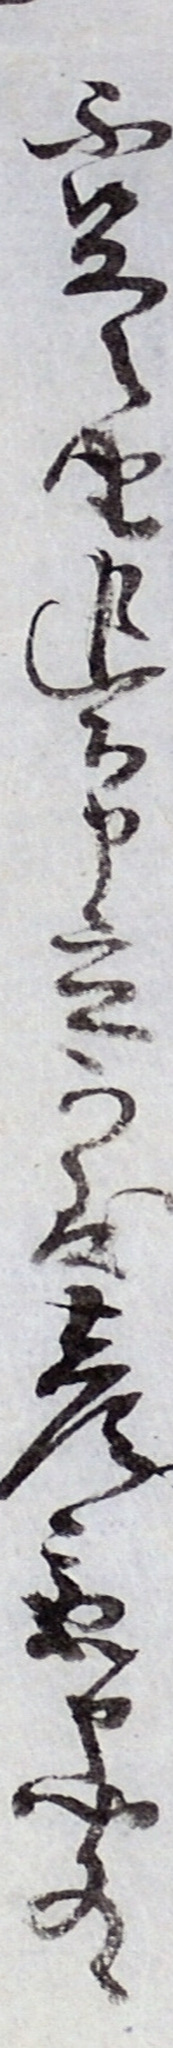不足之由追而申立可致彦兵衛申聞候
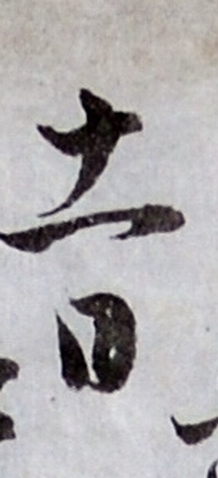十一日
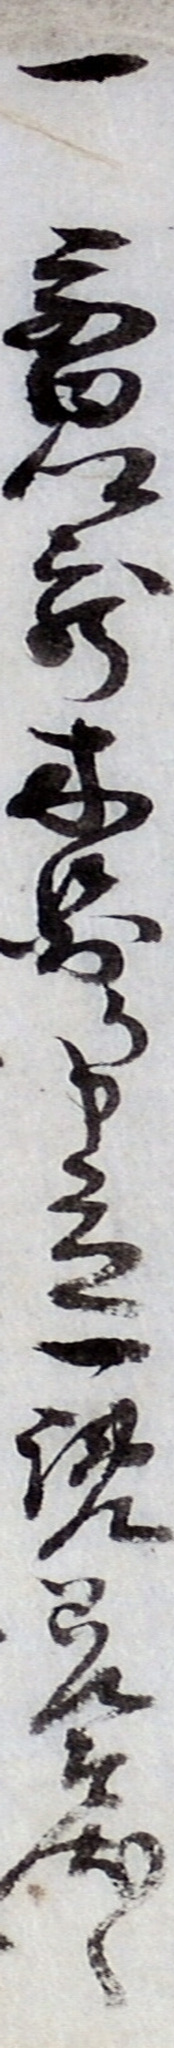一宮田郷蔵木図り申立一覧差戻候
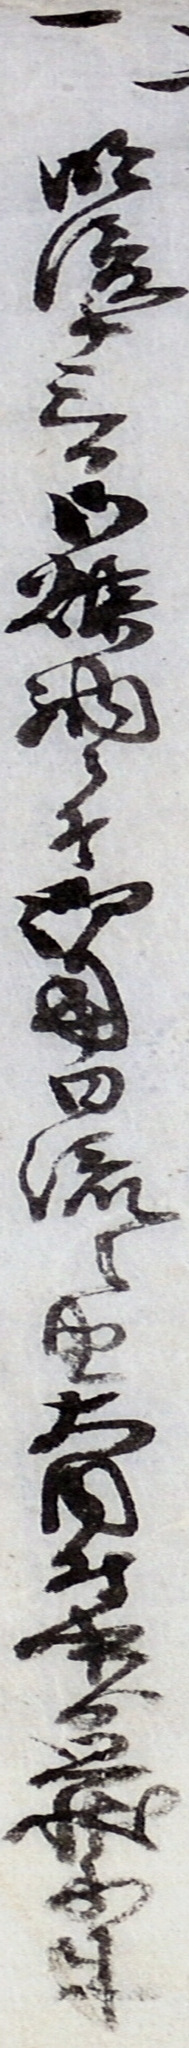一明後十三日御煤納ニ付御用日流之由大目付中ゟ廻状至来
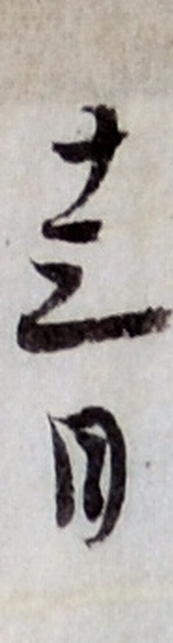十三日
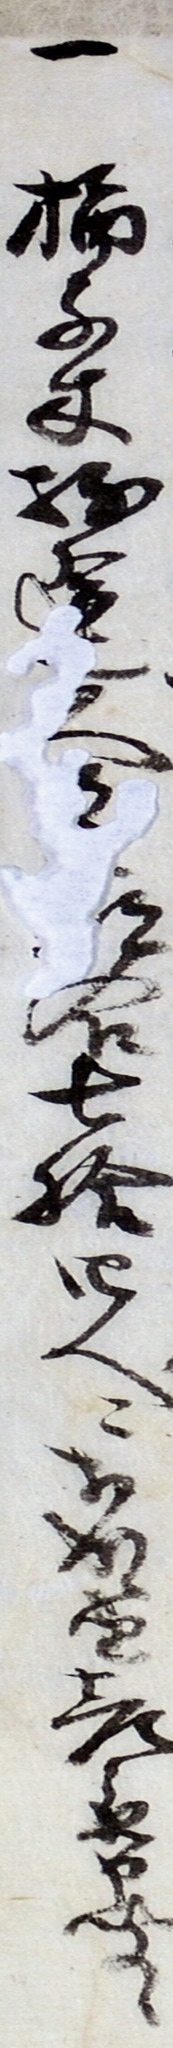一桶子木持運人足都合七拾四人ニ相成候由彦兵衛申聞候
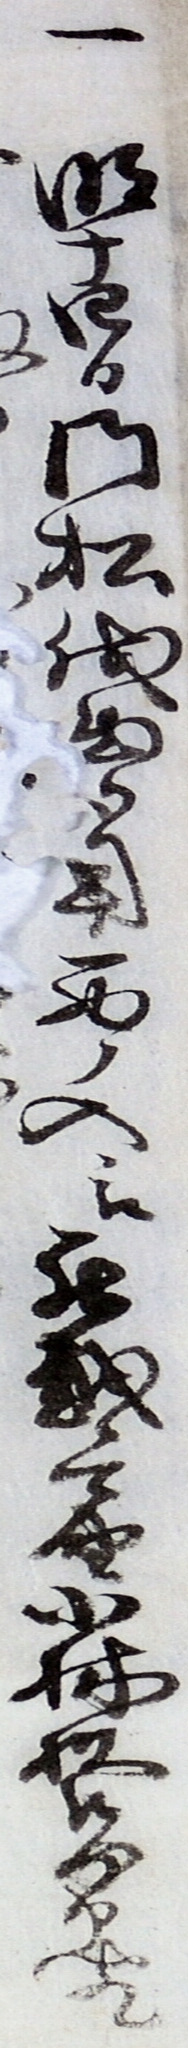一明十四日門松伐出御用西ノ入江罷越候届小林杦左衛門申聞候
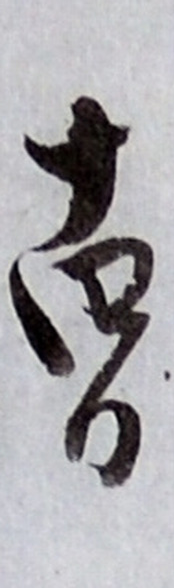十四日
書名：御山奉行御用留
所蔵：伊那市立高遠町図書館・合同会社AMANE
